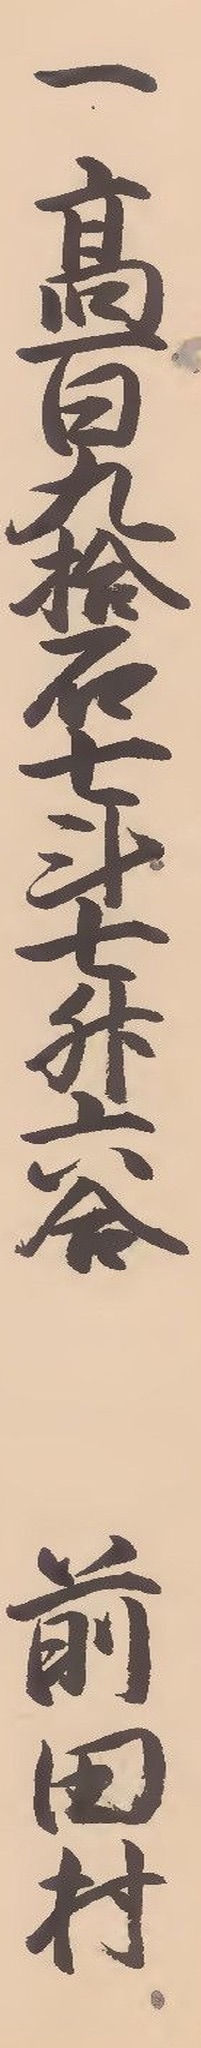一高百九拾石七斗七升六合前田村
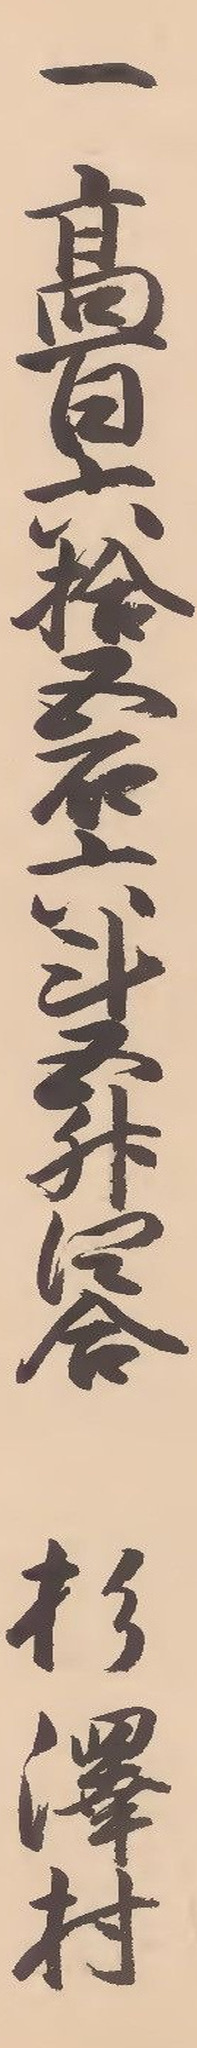一高百六拾五石六斗五升四合杉沢村
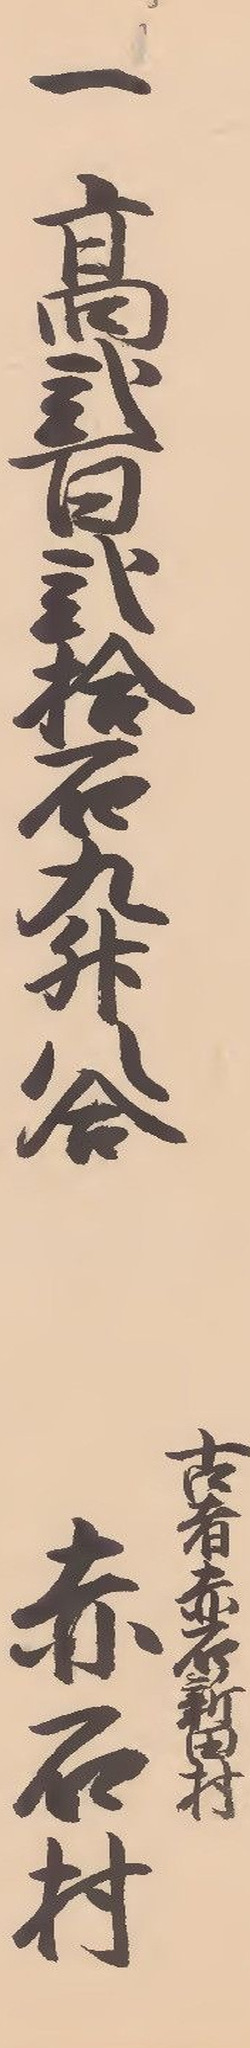一高弐百弐拾石九升八合赤石村
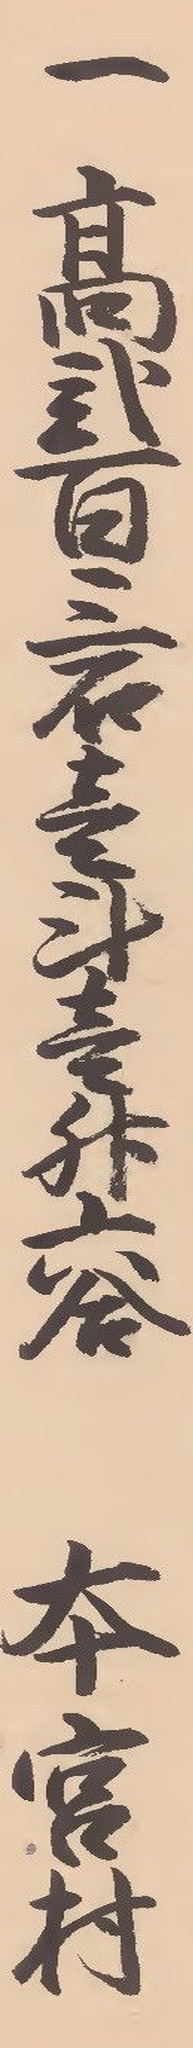一高弐百三石壱斗壱升六合本宮村
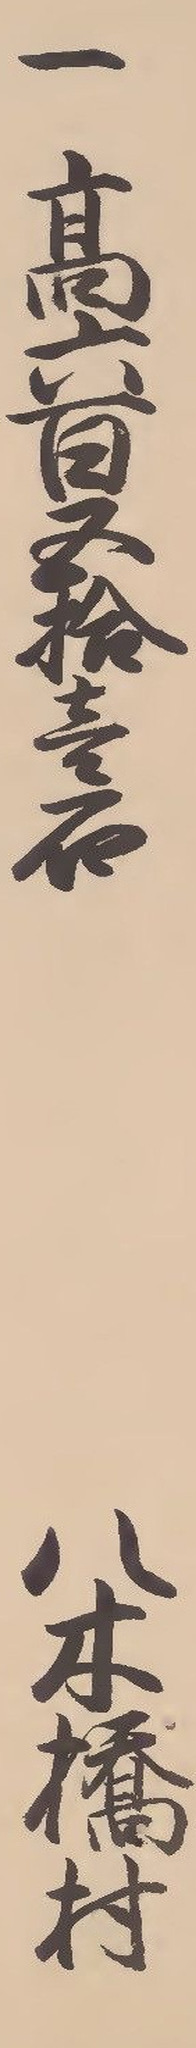一高六百五拾壱石八木橋村
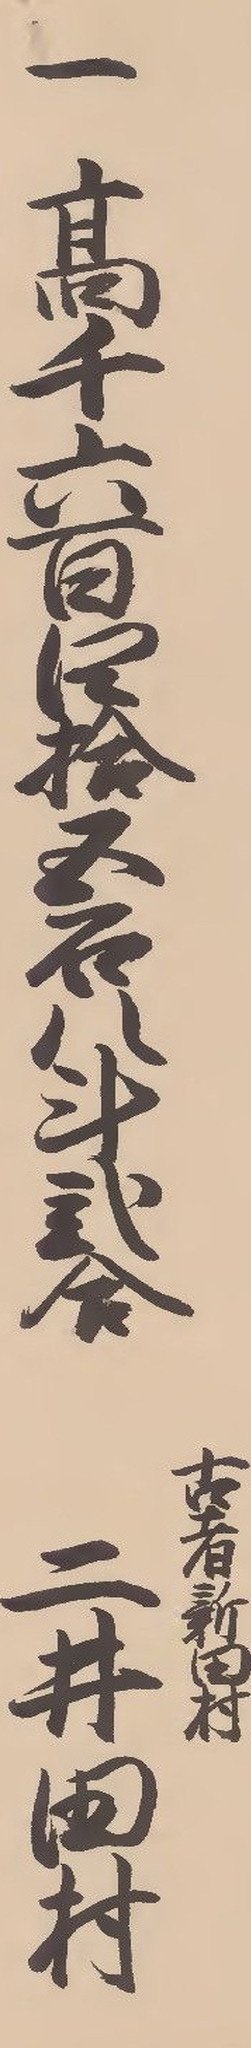一高千六百四拾五石八斗弐合二井田村
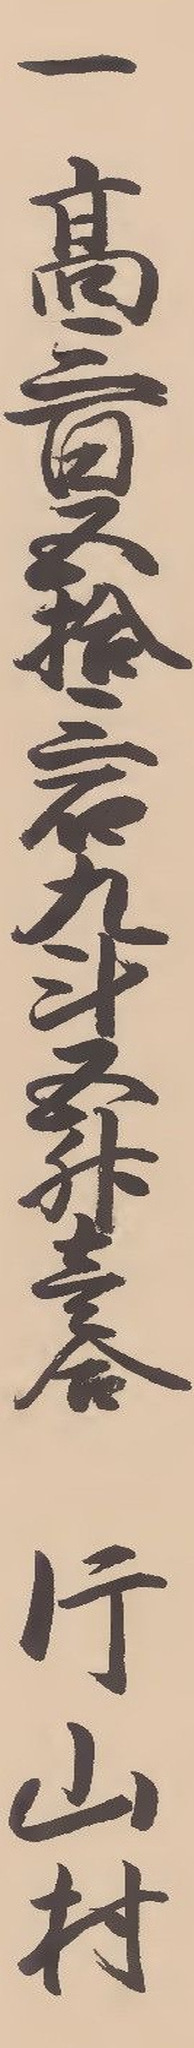一高三百五拾三石九斗五升壱合片山村
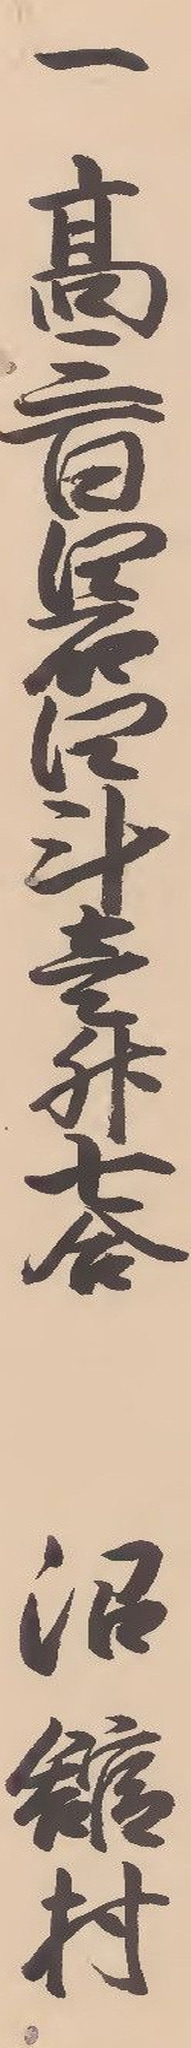一高三百四石四斗壱升七合沼館村

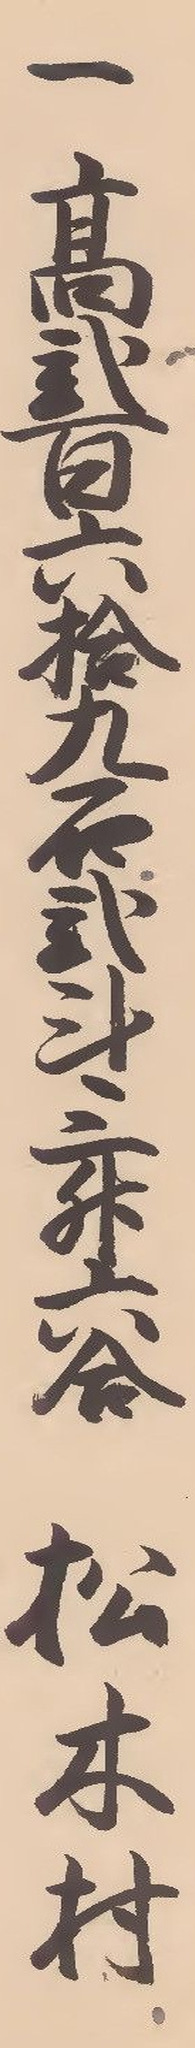一高弐百六拾九石弐斗三升六合松木村
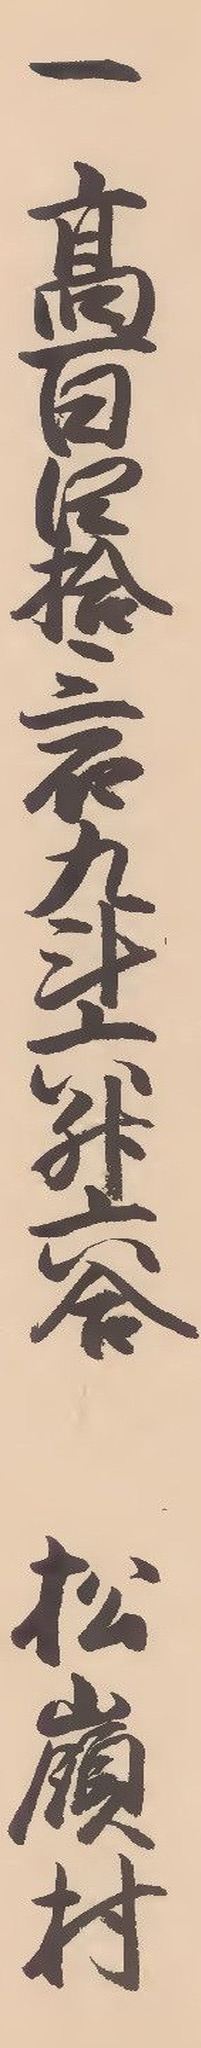一高百四拾三石九斗六升六合松嶺村
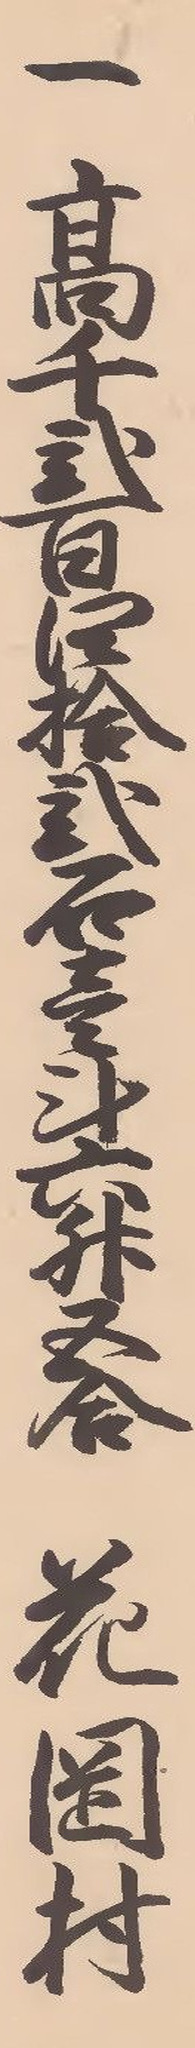一高千弐百四拾弐石壱斗六升五合花岡村
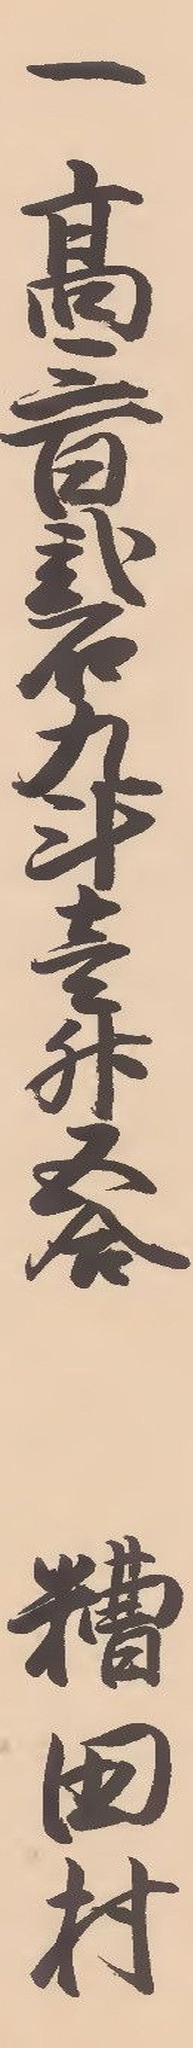一高三百弐石九斗壱升五合糟田村
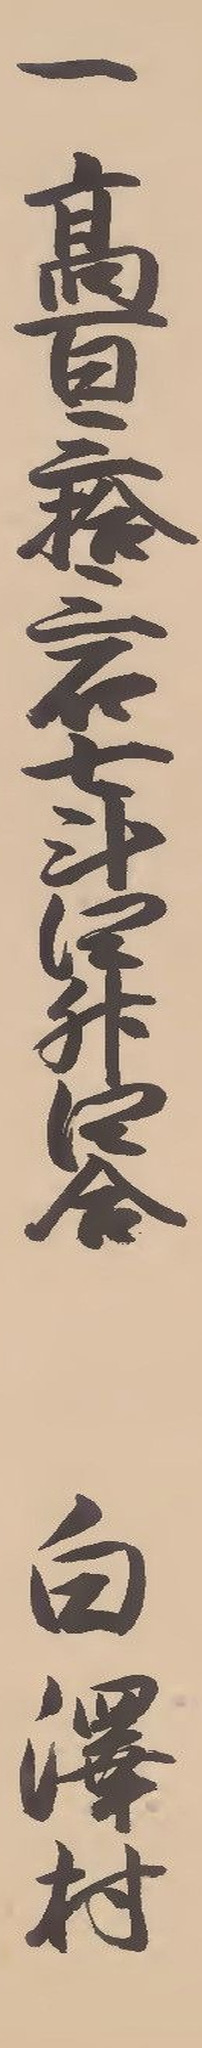一高百三拾三石七斗四升四合白沢村
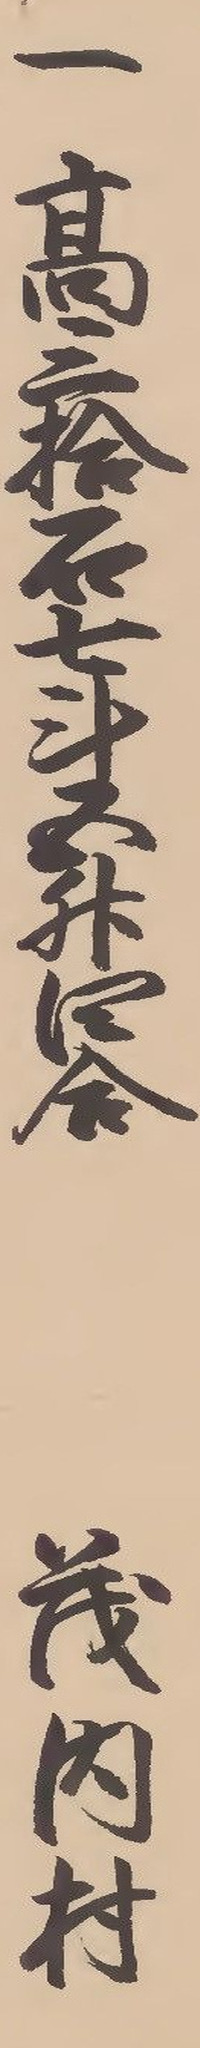一高三拾石七斗五升四合茂内村
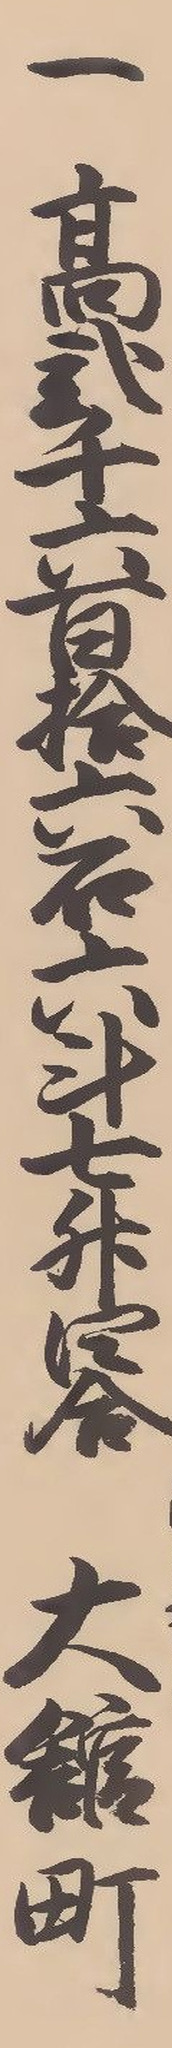一高弐千六百拾六石六斗七升四合大館町
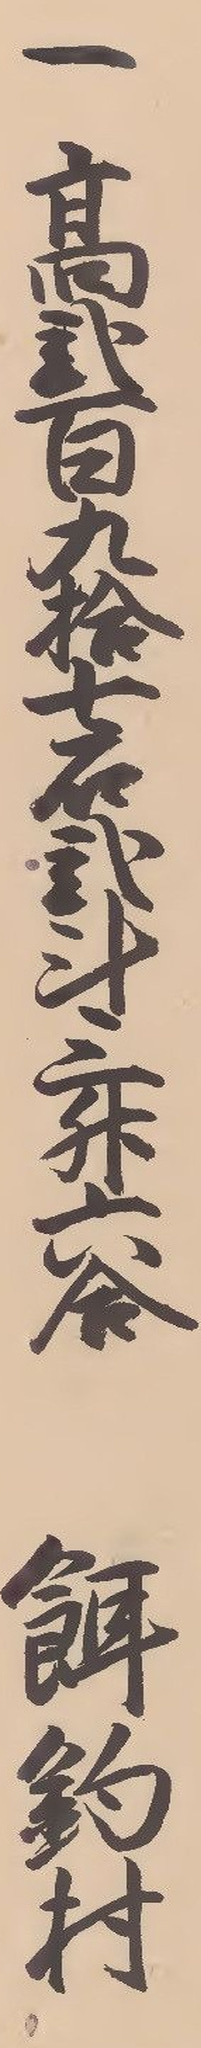一高弐百九拾七石弐斗三升六合餌釣村
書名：出羽国郷帳　５
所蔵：国立公文書館 National Archives of Japan
